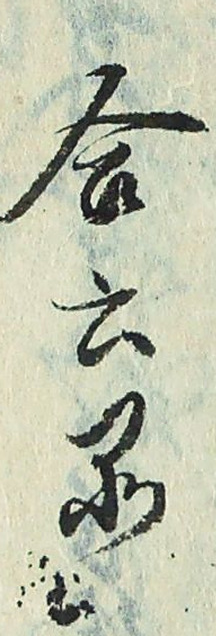合六品

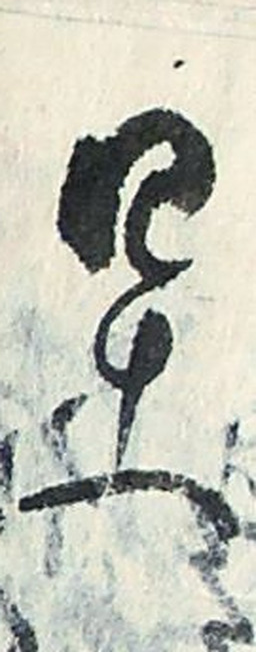四十一
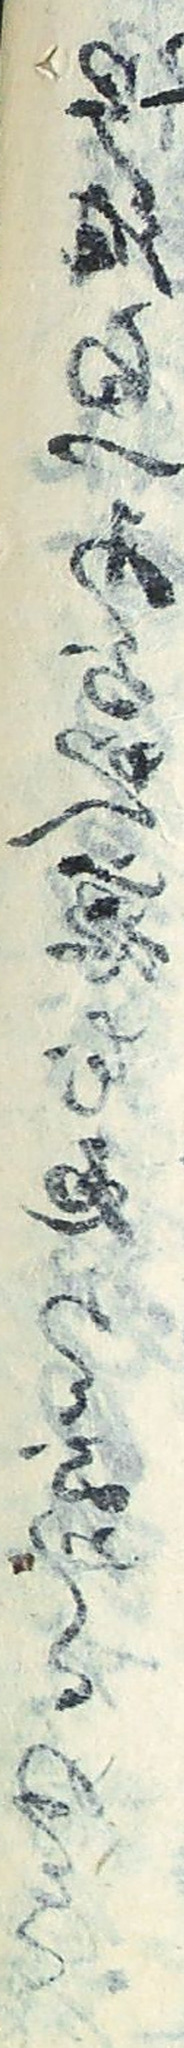亥十一月十六日
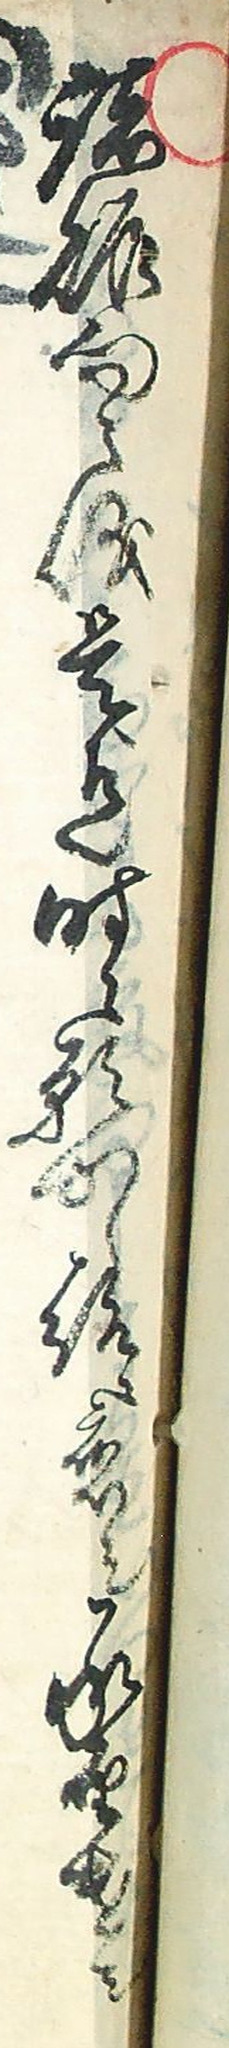諸賑向之儀是迄時々願出候趣ニ應シ承届遣シ
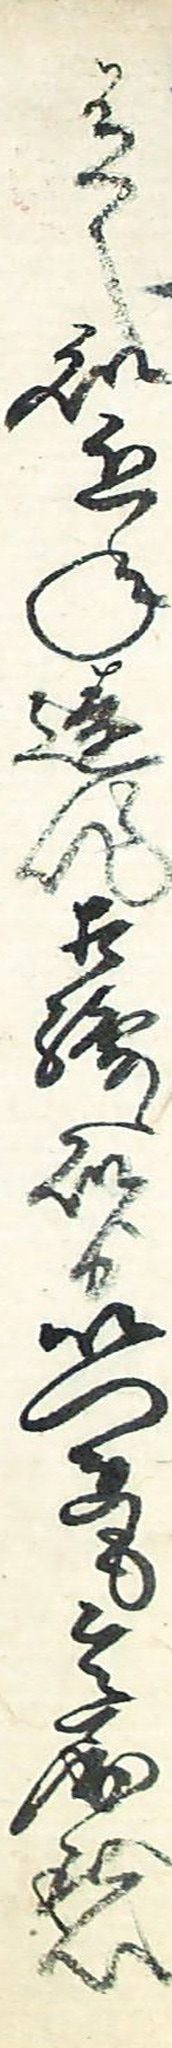有之処近年違作打續候処ゟいつれも令屈愁
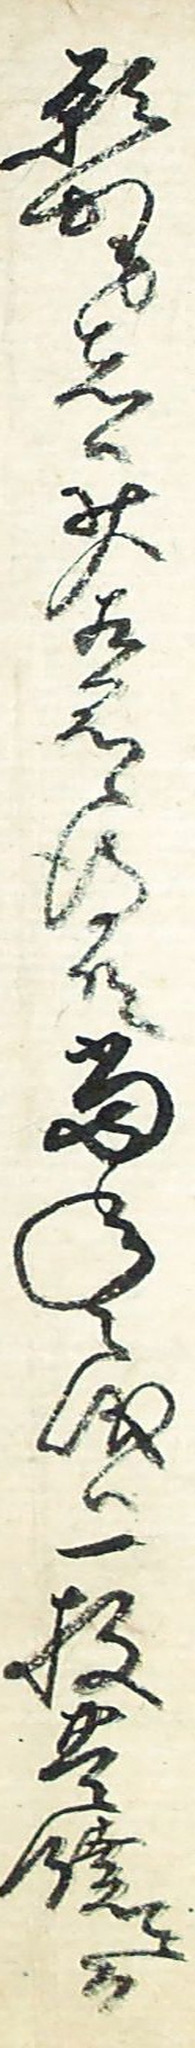願出も先ハ少相見候得共當年之儀ハ一牧豊穣ニ而
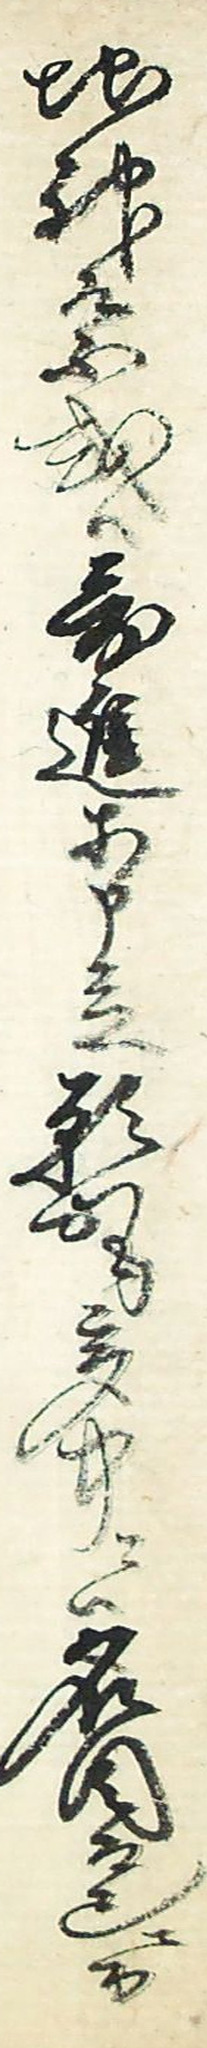地神祭或ハ寄進等申立願出も多中ニハ名目而已ニ而
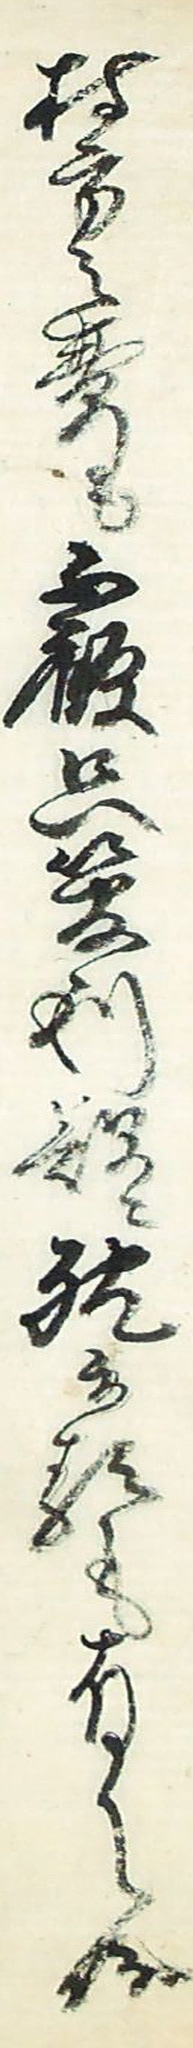村方之費も不顧只管利欲ニ耽候類も有之儀
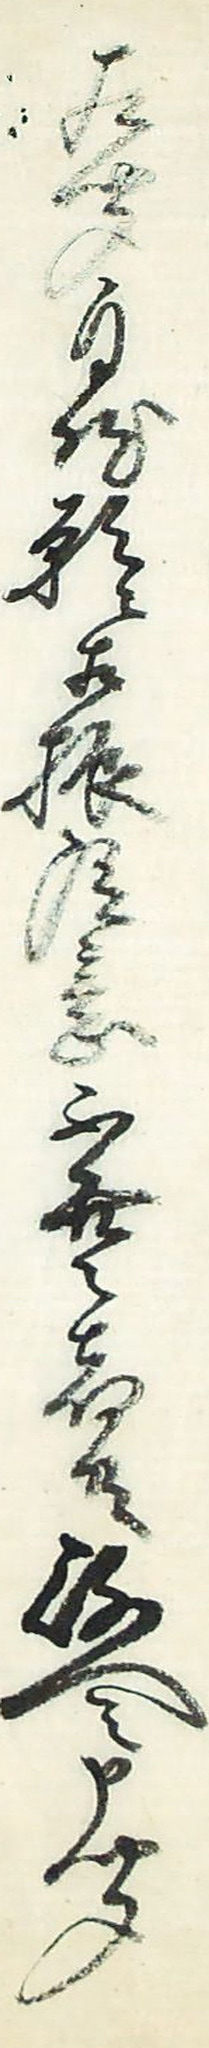相聞自然願ニ相振随意不弁之者共役人之申聞
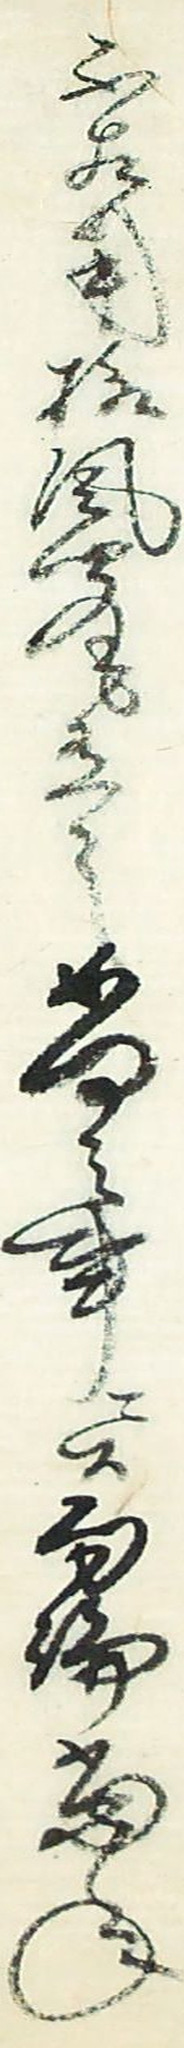不相用様風聞も有之如何之事ニ候勿論當年
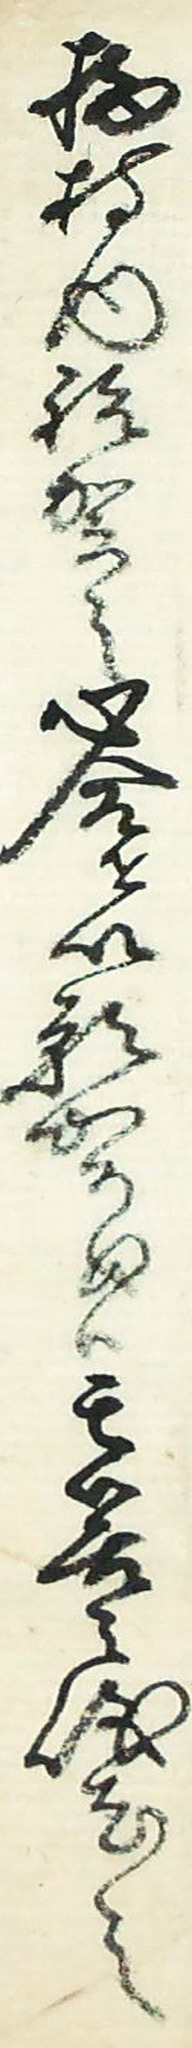柄村内祝賀之心合を以願出候義ハ其筈之儀尤之
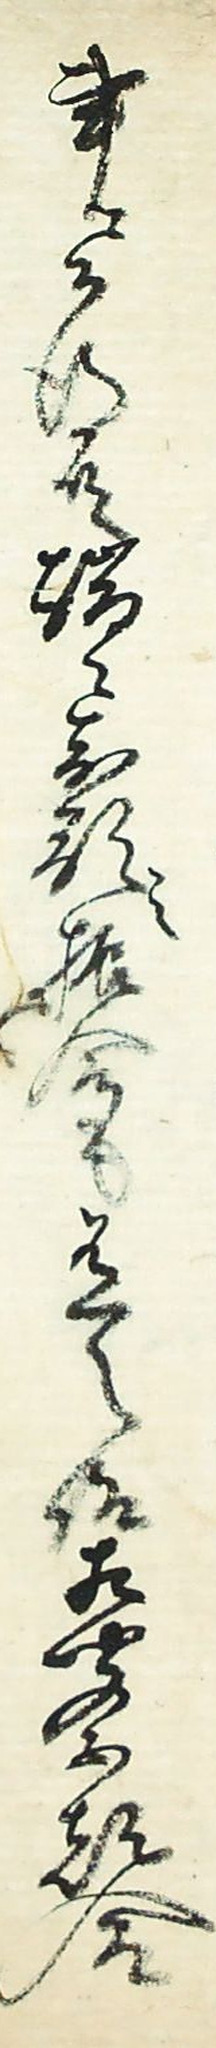事ニ候得共端々前顕之振合も有之候様相聞不都合
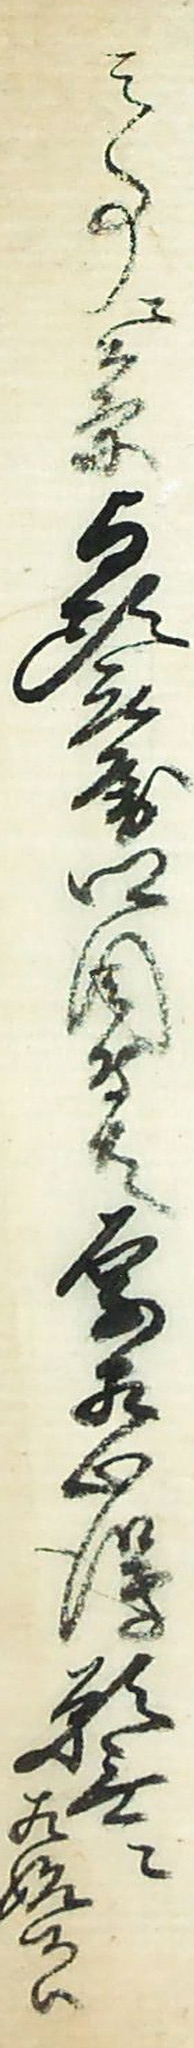之事ニ候条与頭庄屋郷目付共厚相心得願無ニ相始候ハ
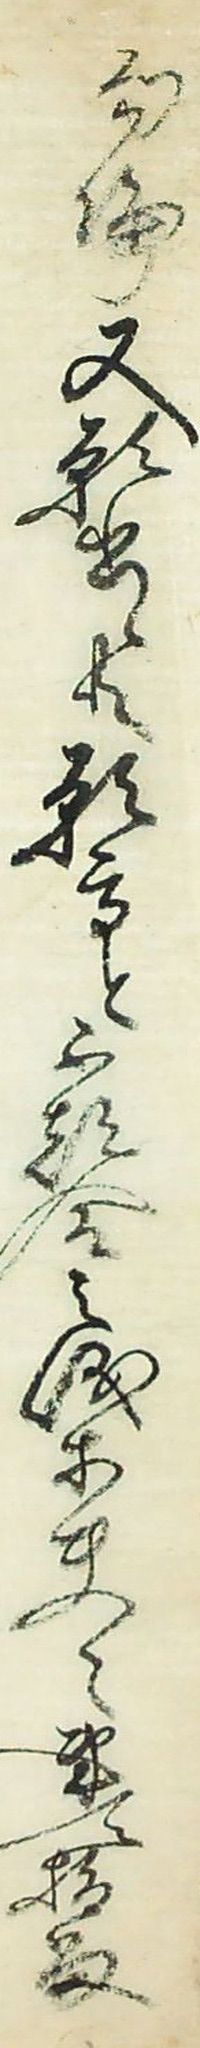勿論又願出候共願方と不都合之儀等夫々速ニ指留
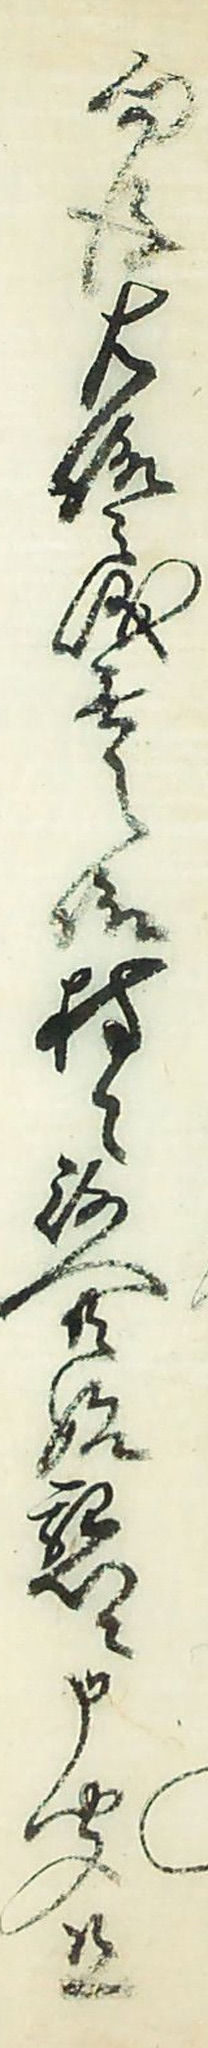向後右様之儀無之候様村々役人共始懇ニ申聞且
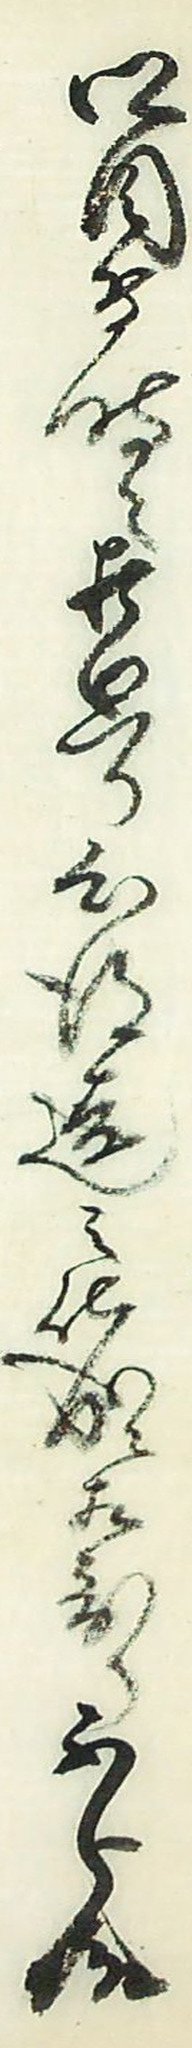郷目付時々打廻り心得違之仕成ニ相到り不申様
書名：諸御趣意書并御下知向之写
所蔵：鳴門教育大学 Naruto University of Education
